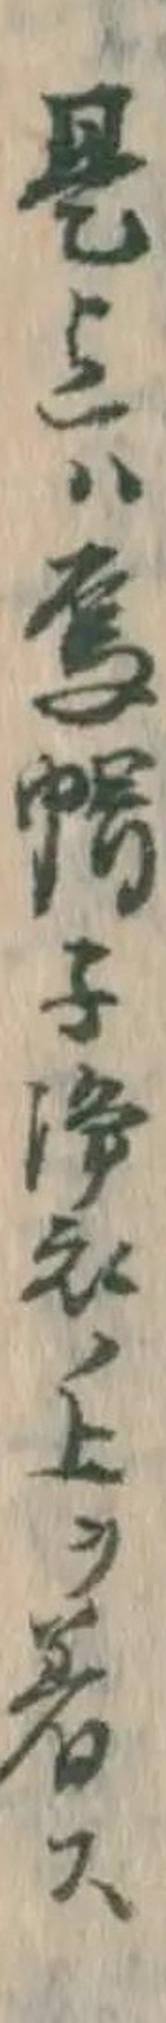是ヨリ烏帽子浄衣ノ上ヲ撤ス
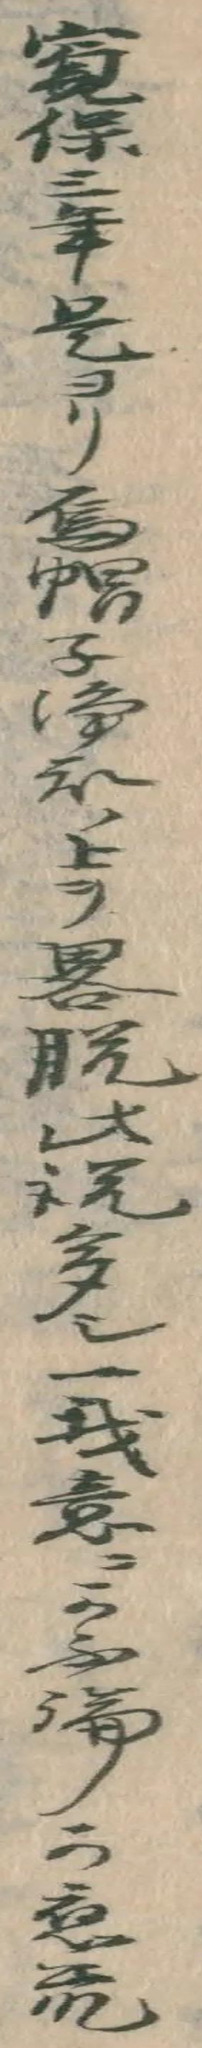寛保三年是ヨリ烏帽子浄衣ノ上ヲ略脱此説多シ一我意ニ可不論可応衆
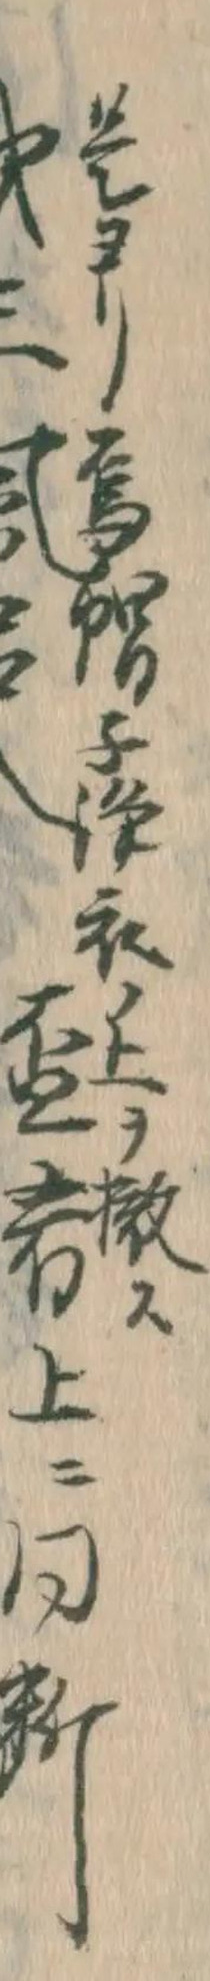是ヨリ烏帽子浄衣ノ上ヲ撤ス
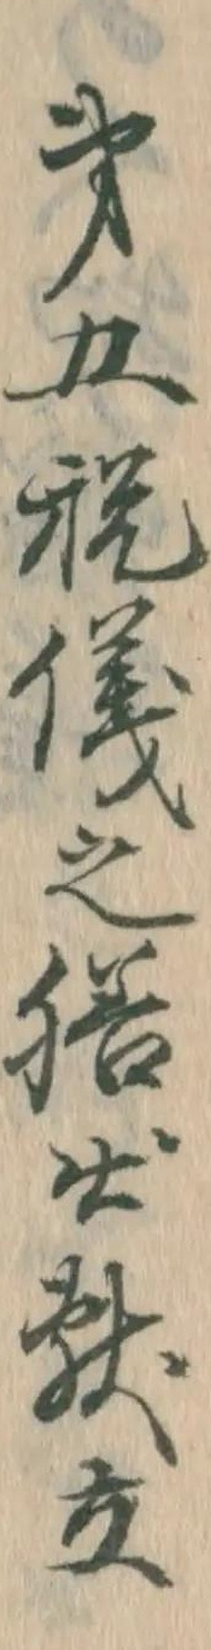第五祝儀之膳出献立

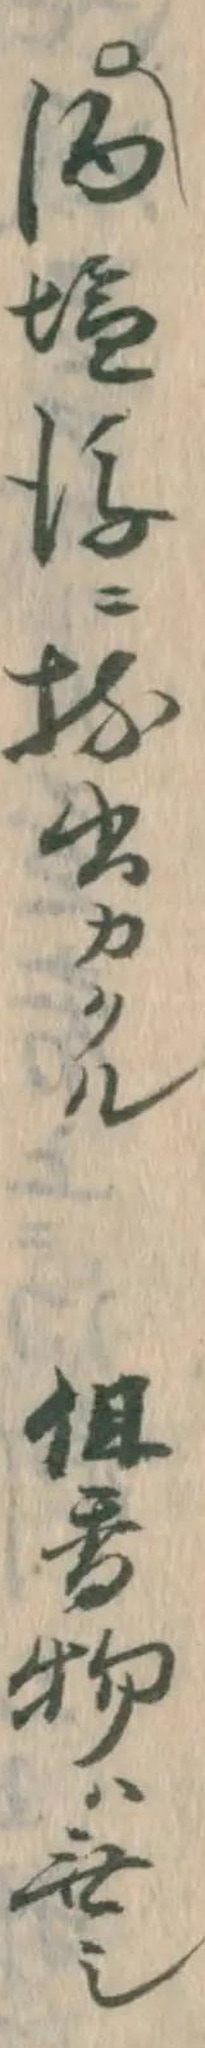○/酒塩後ニ持出カクル但香物ハ無シ
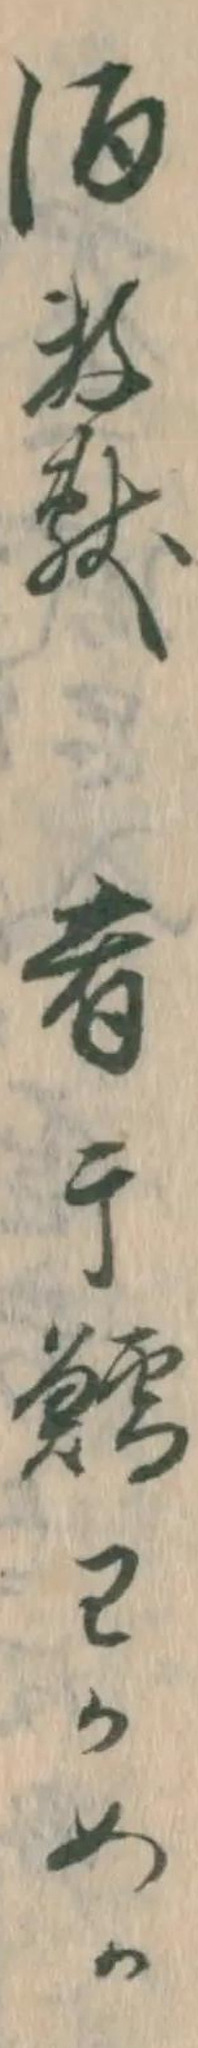酒数献肴干鱈わかめか
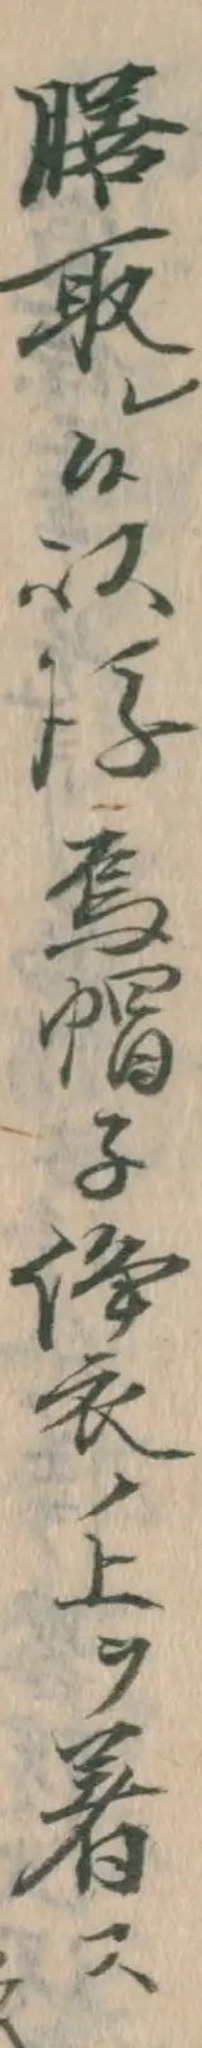膳取候以後烏帽子浄衣ノ上ヲ着ス
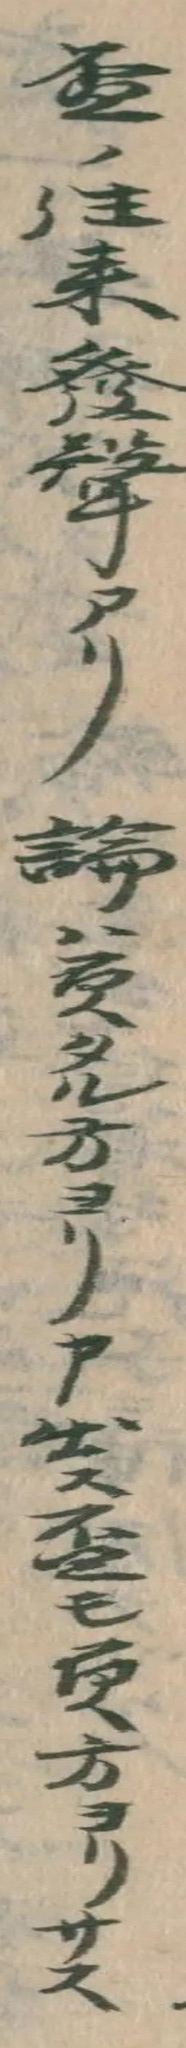盃ノ往来発声アリ論ハ負タル方ヨリ申出ス盃モ魚方ヨリサス
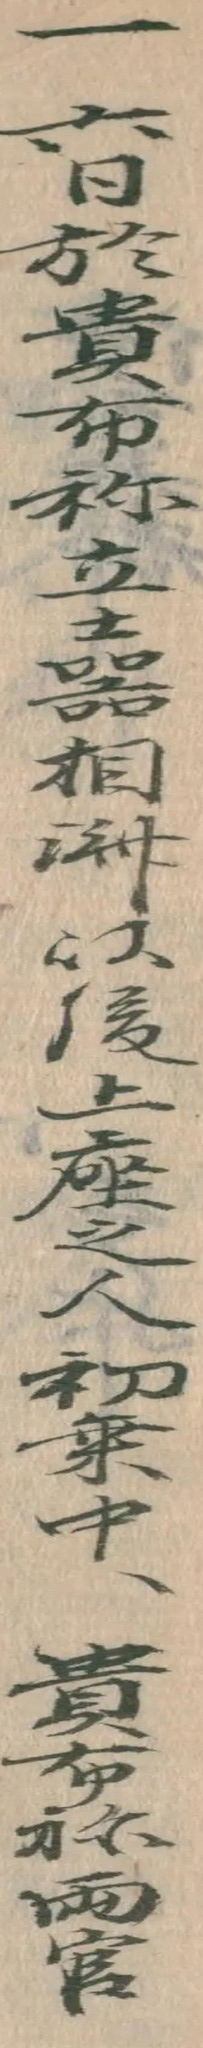一六日於貴布禰立土器相済以後上座之人初乗中へ貴布祢禰両官
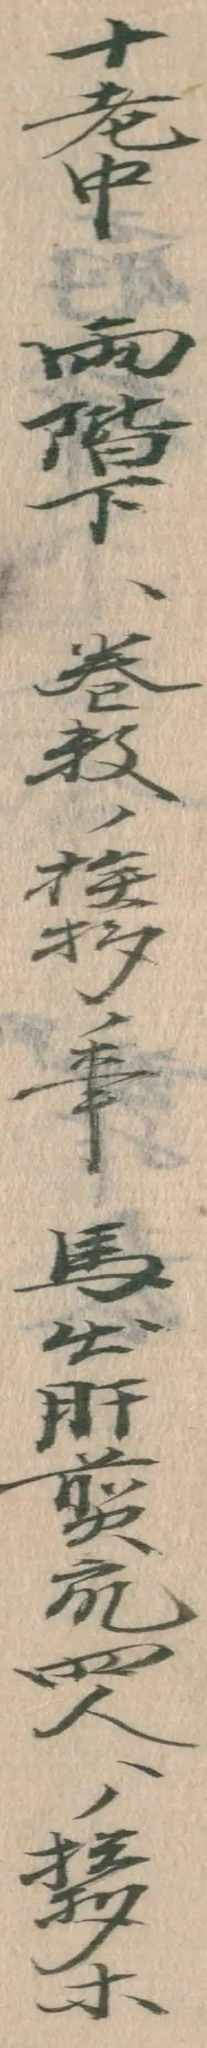十老中両階下へ巻数ノ挨拶ノ事馬出肝煎衆四人ヘノ挨拶等
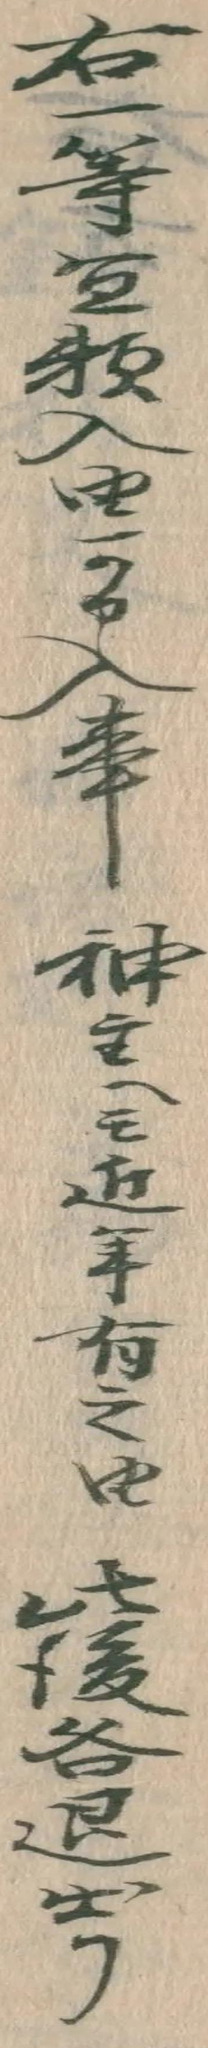右一等宜頼入由可申入事神主ヘモ近年有之由此後各退出了
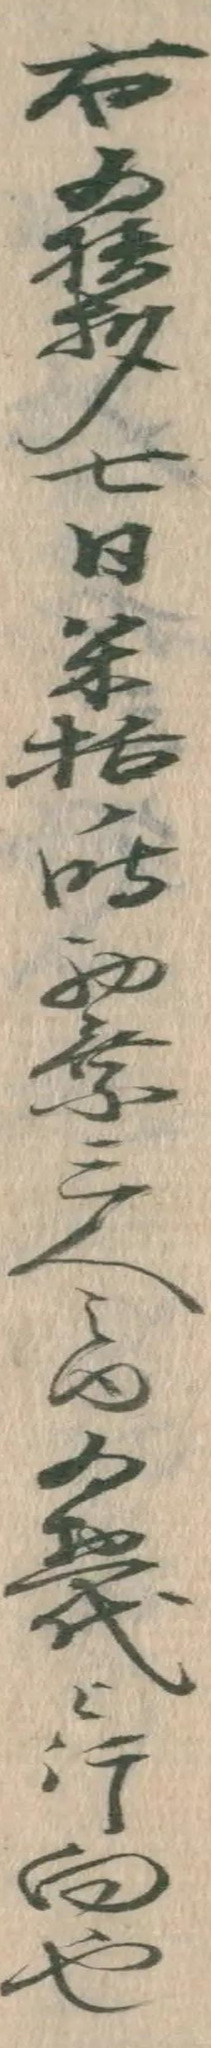右為挨拶七日米括ノ時初乗三人之内為惣代被行向也
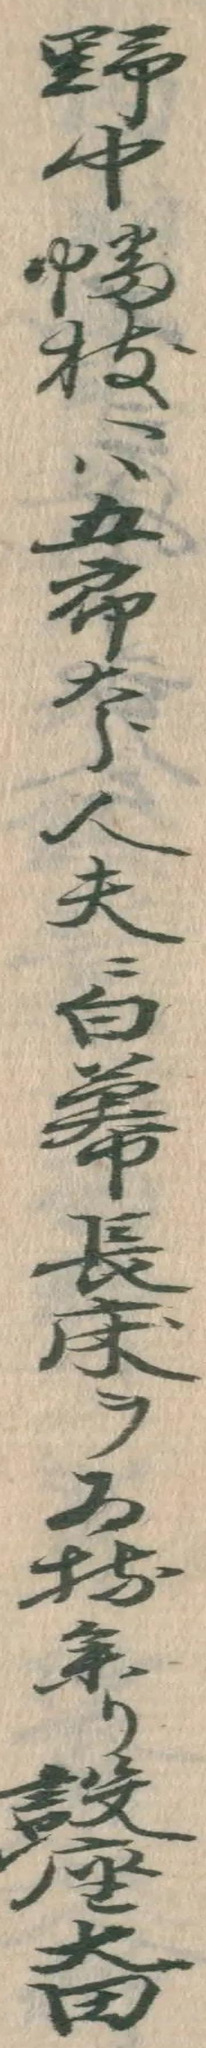野中幡枝ヘハ五郎大郎人夫ニ白幕長床ヲ為持参リ設座大田

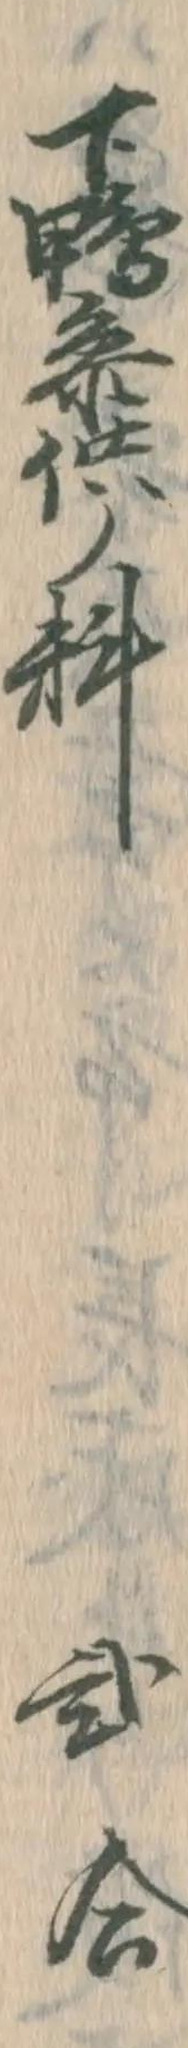下鴨参供ノ料弐合
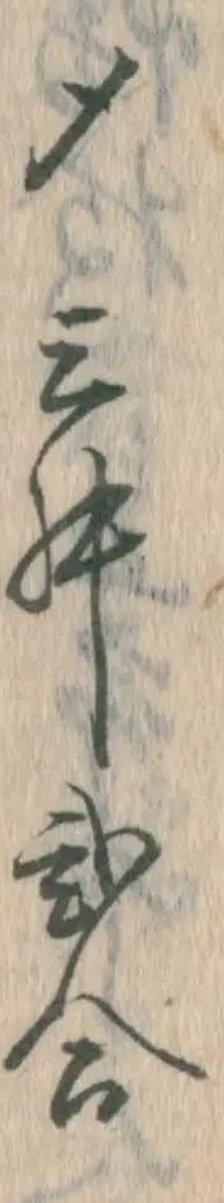〆三升弐合
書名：賀茂社記録. 第11冊
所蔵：国立国会図書館 National Diet Library, JAPAN
